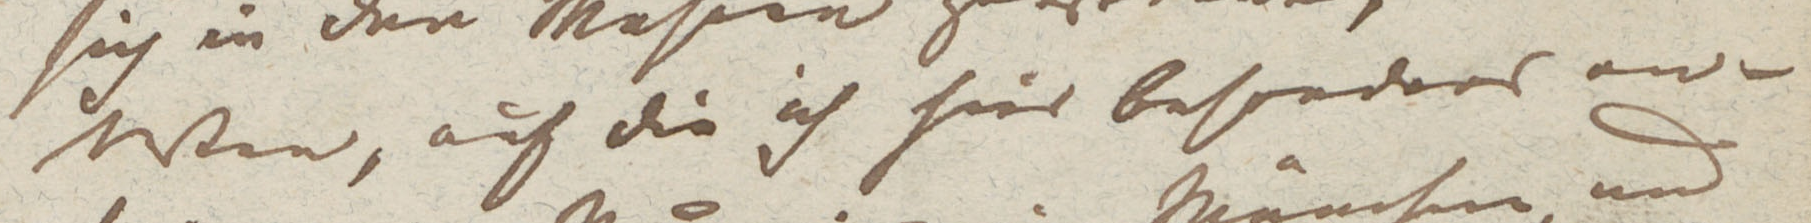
testen, auf die ich hier besonders an-
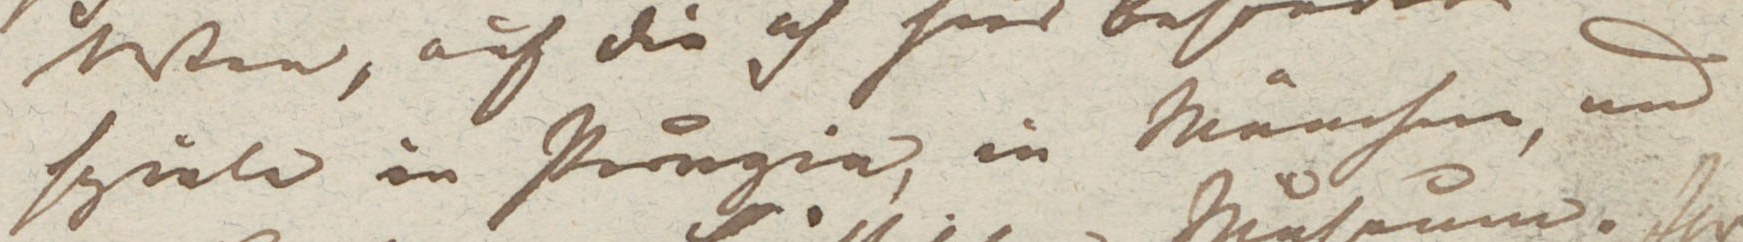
spiele in Perugia, in München, und
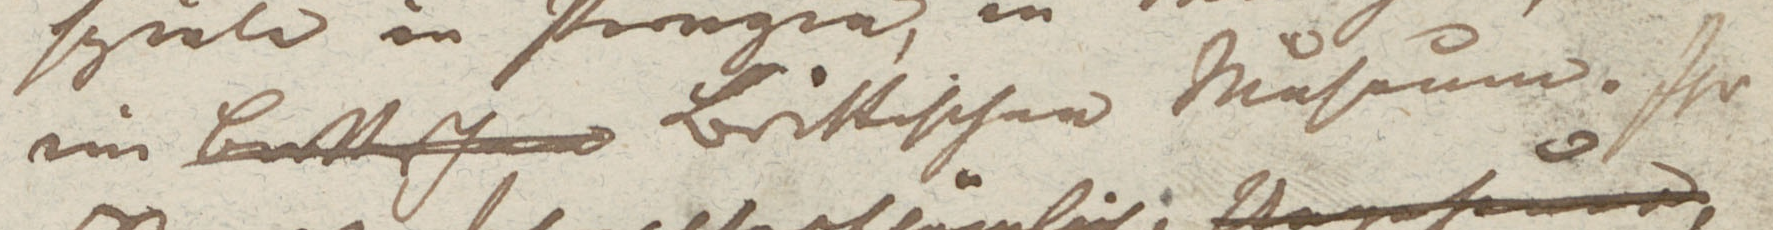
im brittischen Brittischen Museum. Ihr
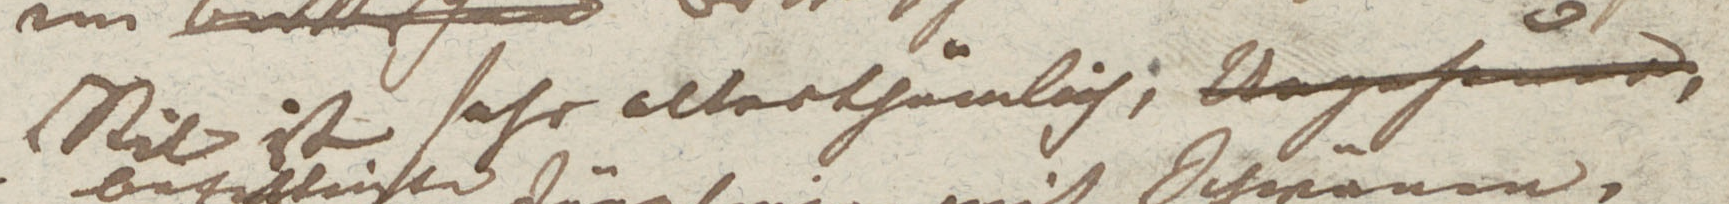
Stil ist sehr alterthümlich; Ungeheuer,
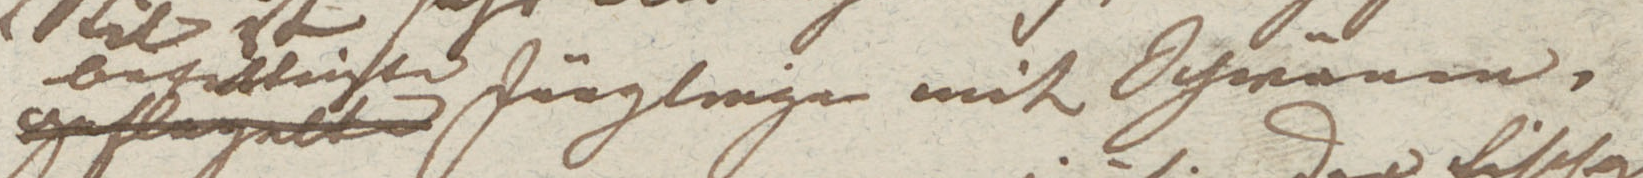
beteiligte Jünglinge mit Schwänen,
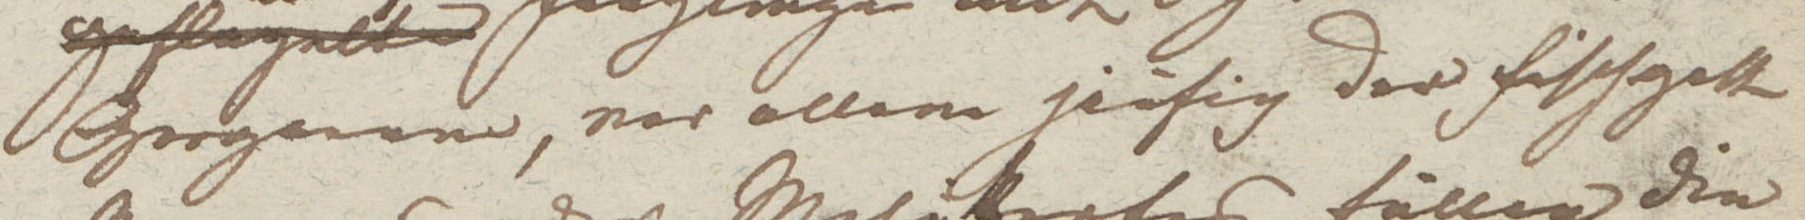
Gorgonen, vor allem häufig der Fischgott
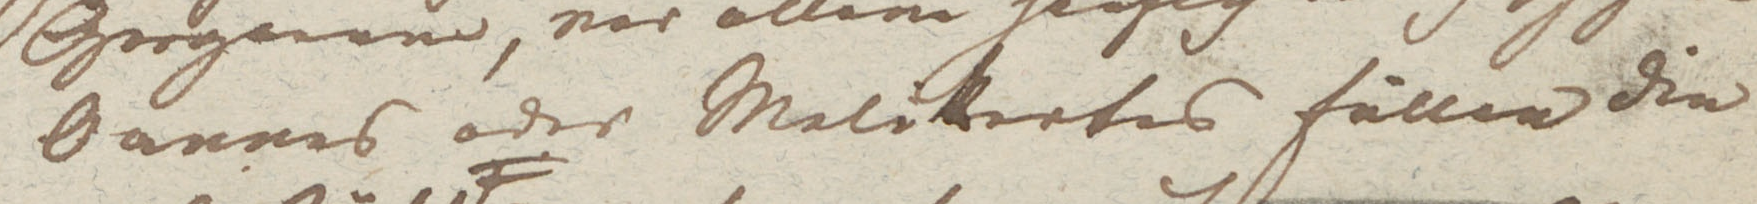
Oannes oder Melikertes füllen die
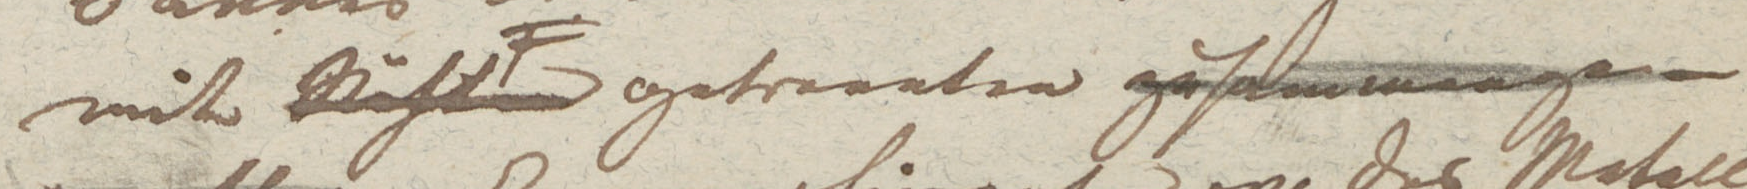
mit Nähten % getrennten zusammenge-
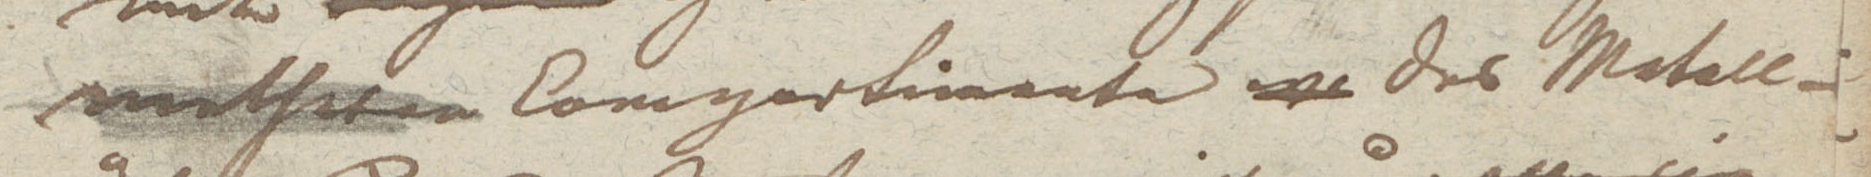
nietheten Compartimente w des Metall-
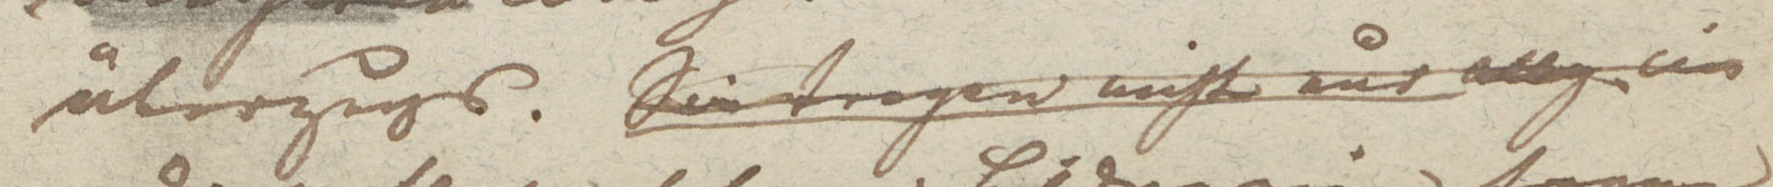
überzugs. Sie tragen nicht nur allg in
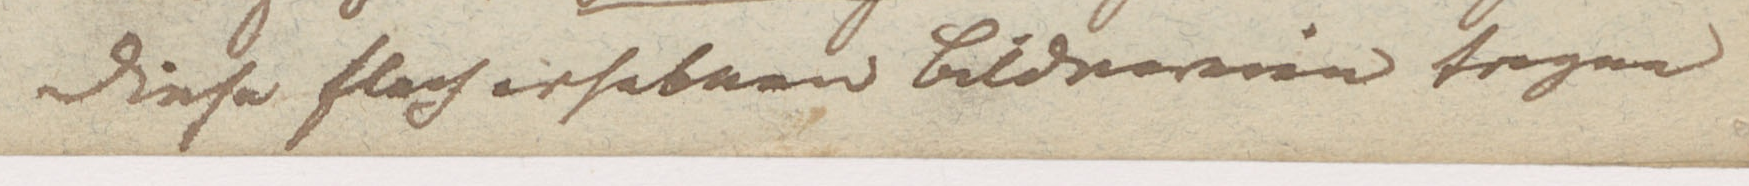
Diese flach erhabenen Bildnereien tragen
